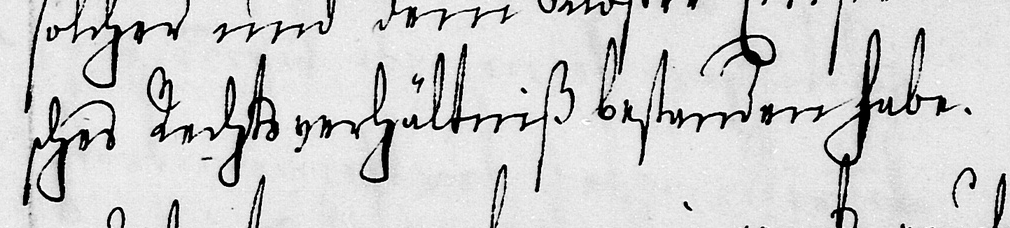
sches Rechtsverhältniß bestanden habe.
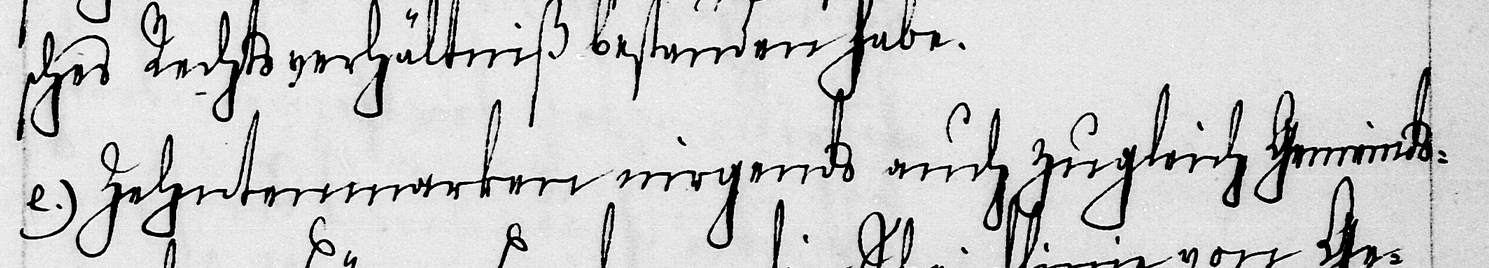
e.) Zehntenmarken nirgends auch zugleich Gemeinds¬
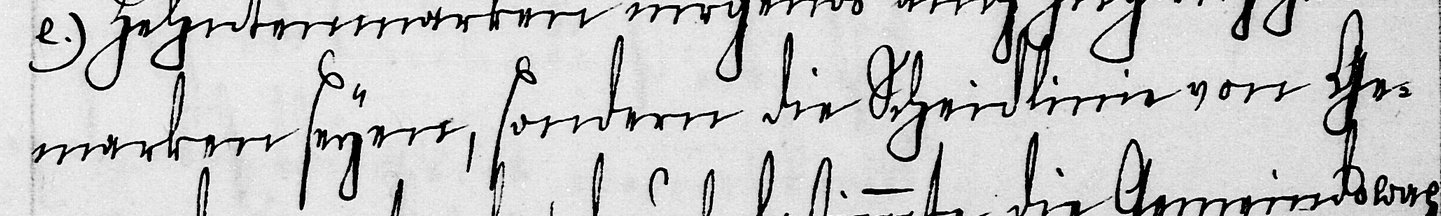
marken seyen, sondern die Scheidlinie von Ge¬
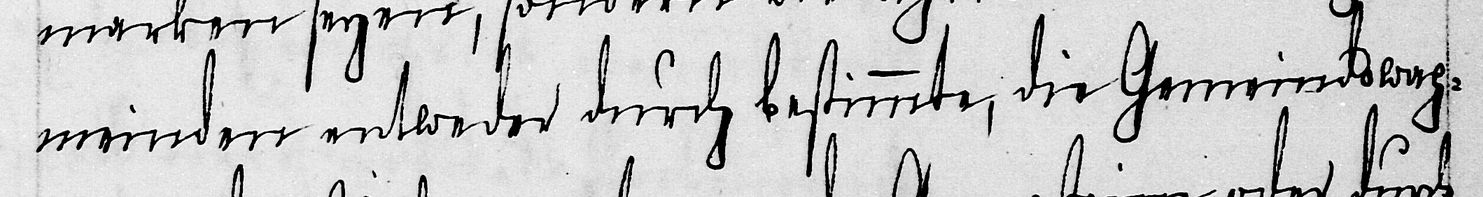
meinden entweder durch bestimmte, die Gemeindswap¬
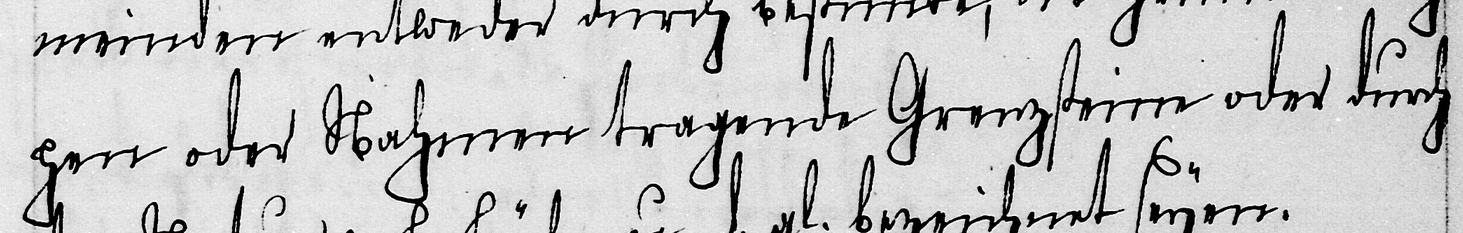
pen oder Nahmen tragende Grenzsteine oder durch
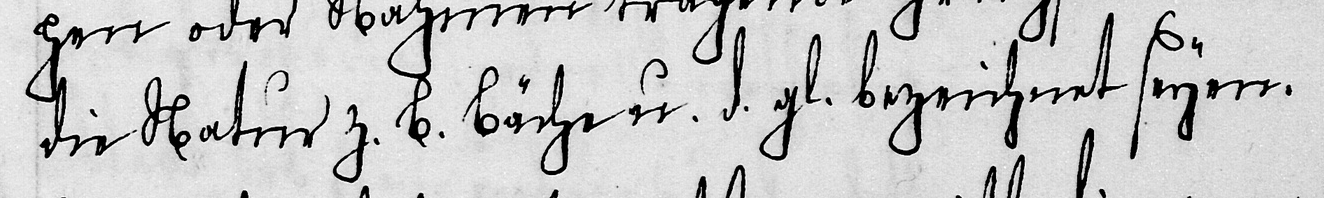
die Natur z.B. Bäche u. d. gl. bezeichnet seyen.
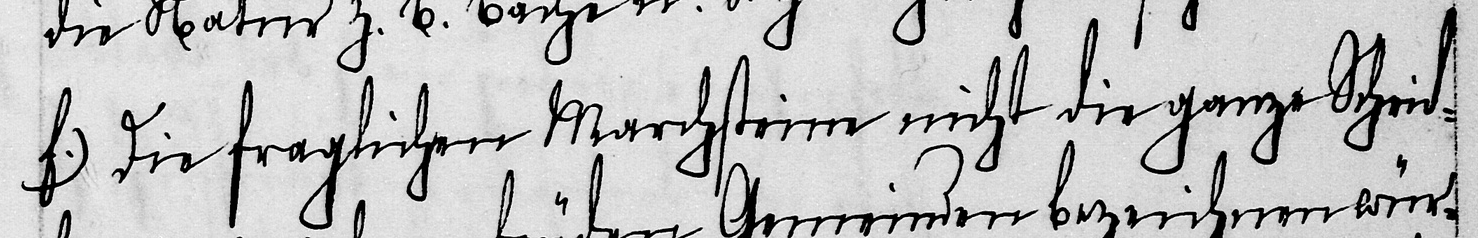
f.) Die fraglichen Marchsteine nicht die ganze Scheid¬
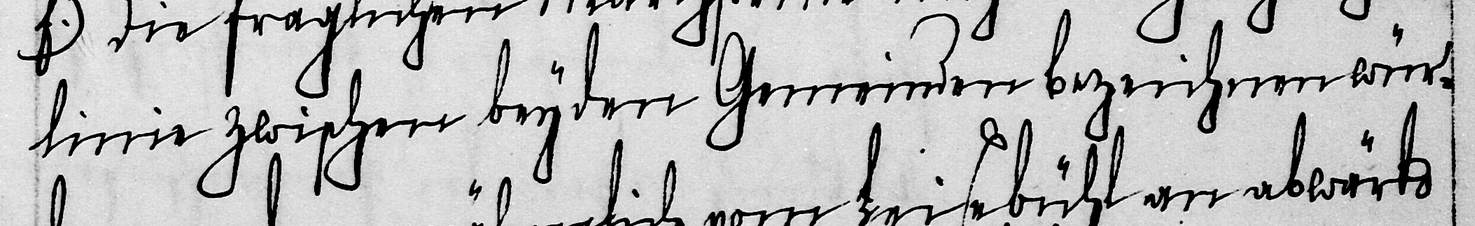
linie zwischen beyden Gemeinden bezeichnen wür¬
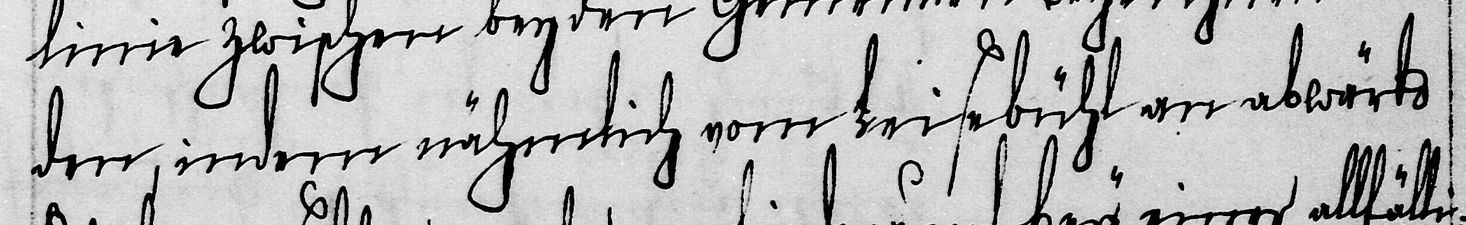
den, indem nämlich vom Leisebühl an abwärts
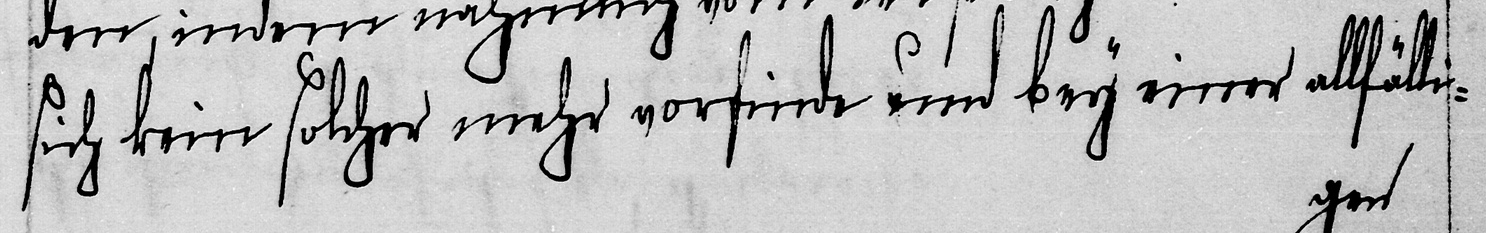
sich kein solcher mehr vorfinde und bey eine allfäl¬
